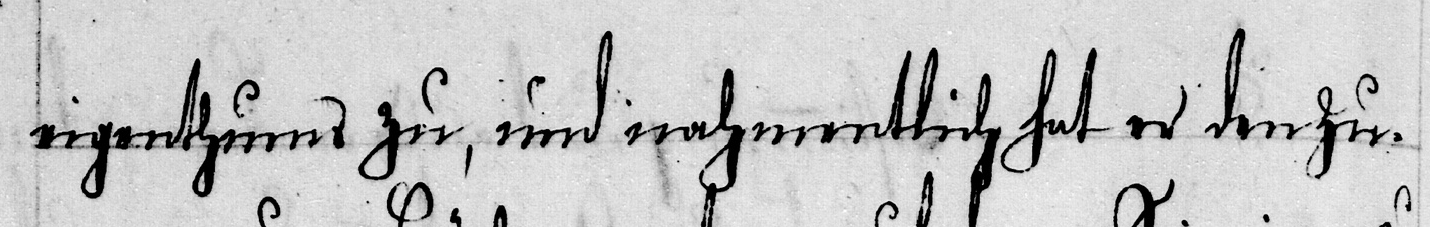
eigenthums zu, und nahmentlich hat er den Zu¬
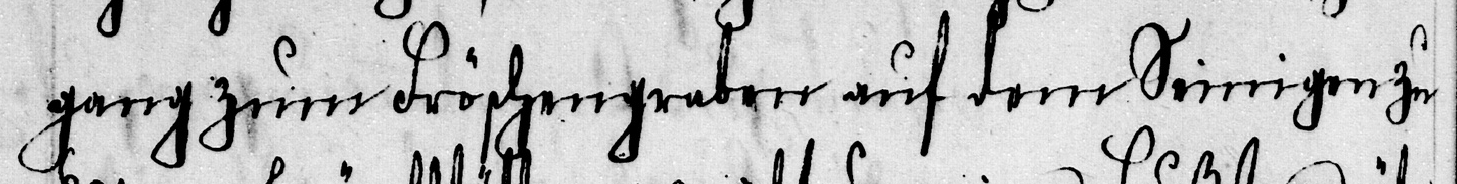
gang zum Fröschengraben auf dem Seinigen zu
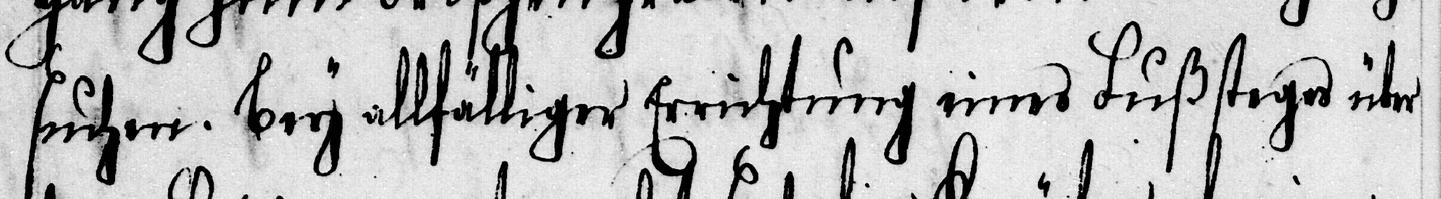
suchen. Bey allfälliger Errichtung eines Fußsteges über
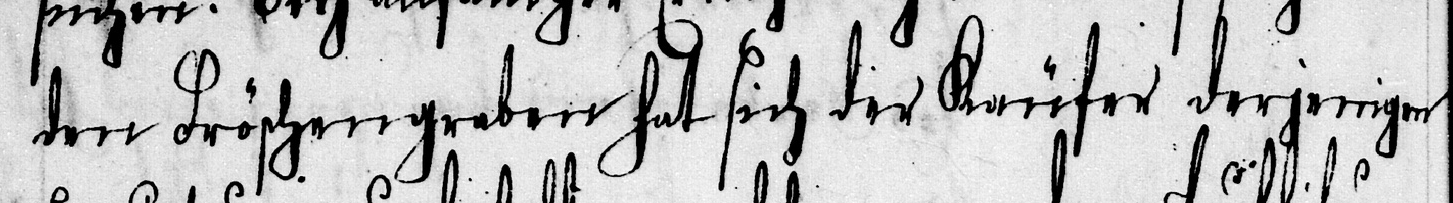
den Fröschengraben hat sich der Käufer derjenigen
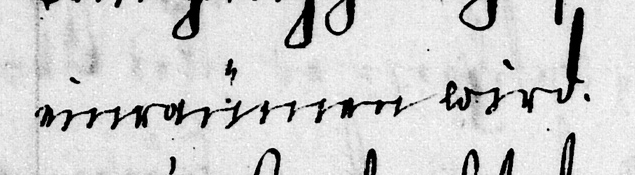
einräumen wird.
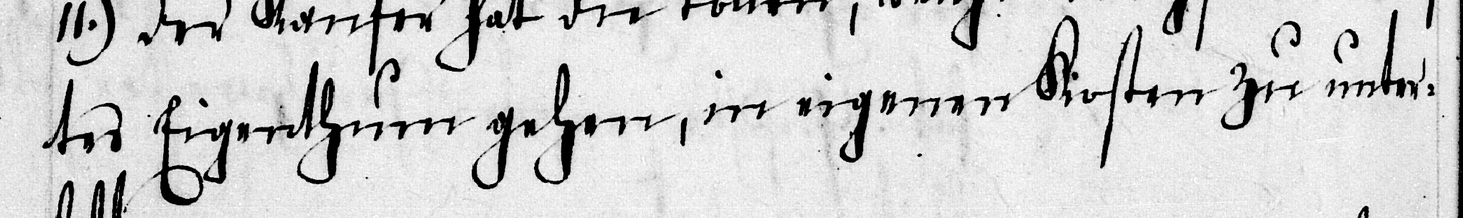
ftes Eigenthum gehen, in eigenen Kosten zu unter¬
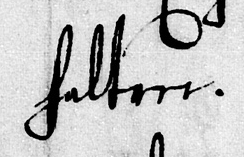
halten.
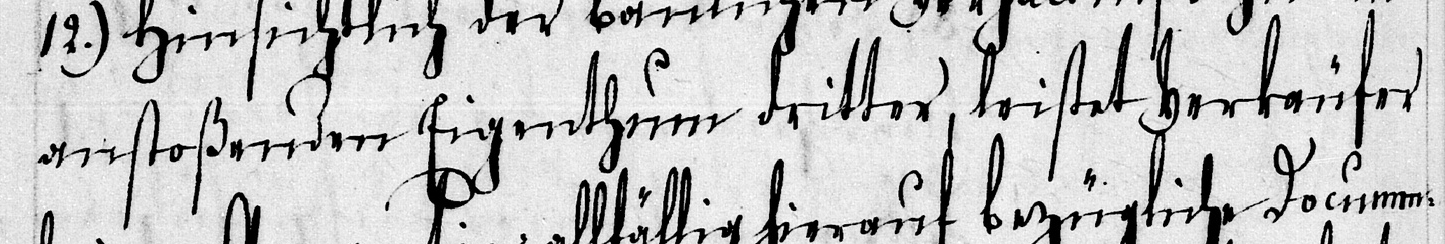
anstoßenden Eigenthum dritter, leistet Verkäufer
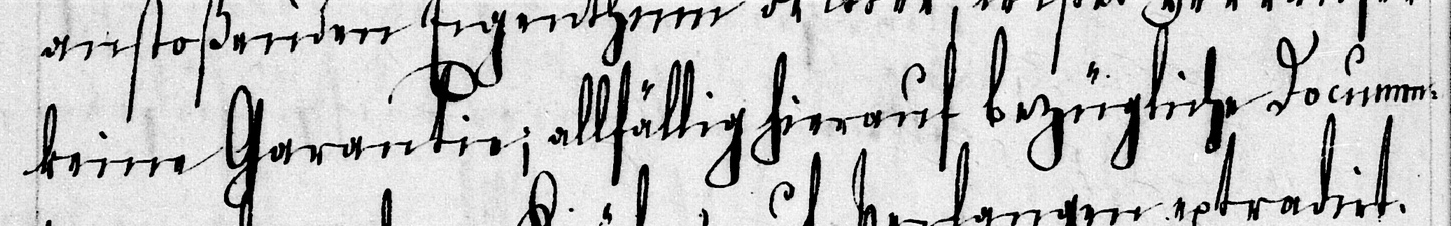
keine Garantie; allfällig hierauf bezügliche Docume¬
